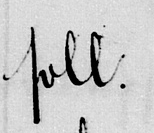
soll.
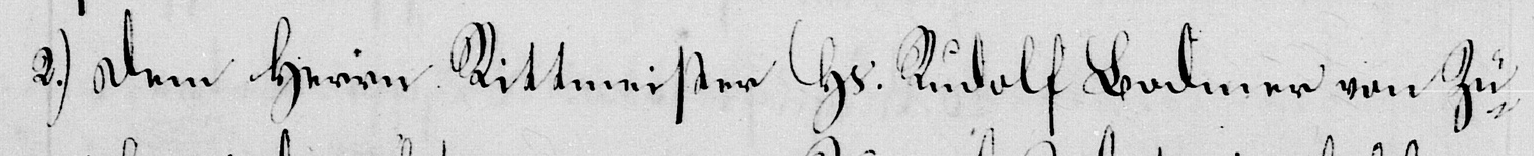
2.) Dem Herrn Rittmeister Hs. Rudolf Bodmer von Zü¬
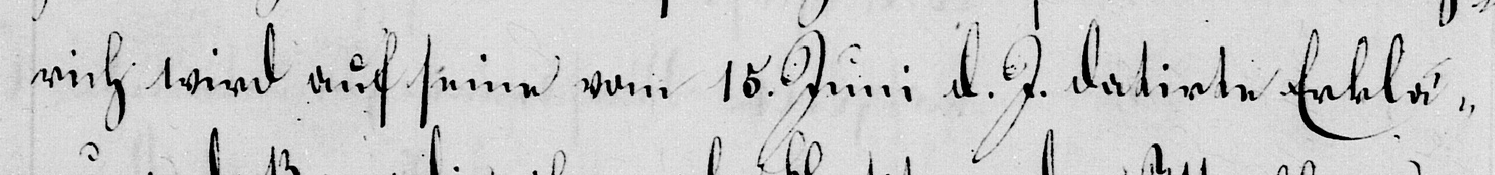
rich wird auf seine vom 15. Juni d. J. datirte Erklä¬
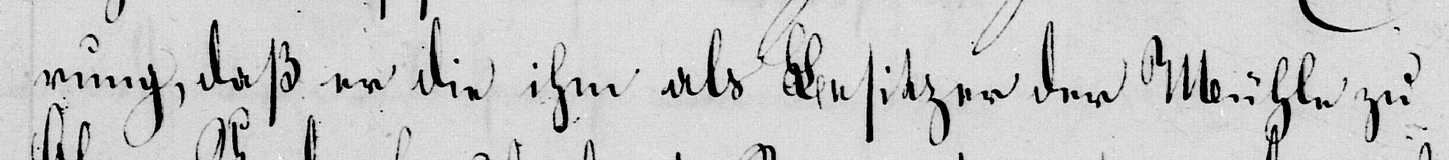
rung, daß er die ihm als Besitzer der Mühle zu
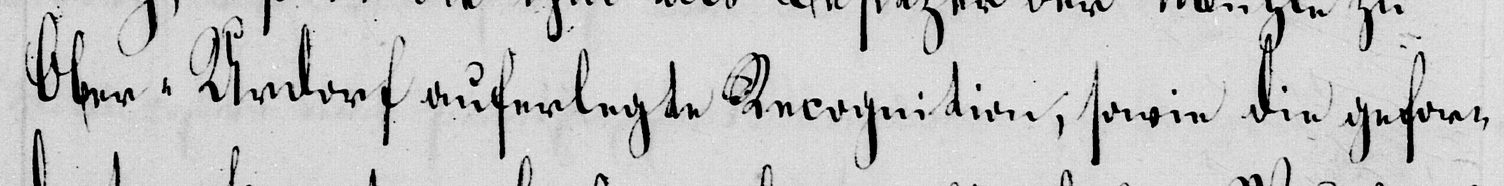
Ober-Urdorf auferlegte Recognition, sowie die gefor¬
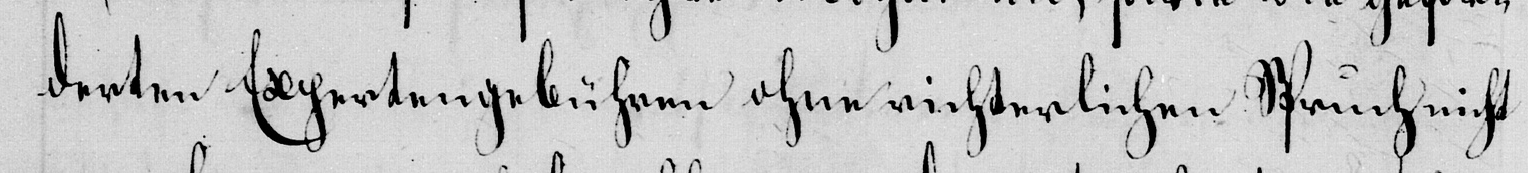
derten Expertengebühren ohne richterlichen Spruch nicht
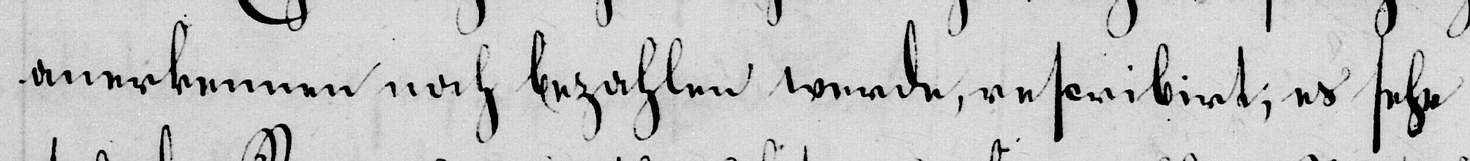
anerkennen noch bezahlen werde, rescribirt, es sehe
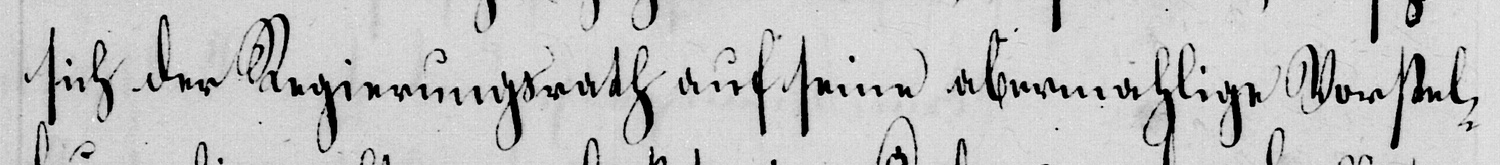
sich der Regierungsrath auf seine abermahlige Vorstel¬
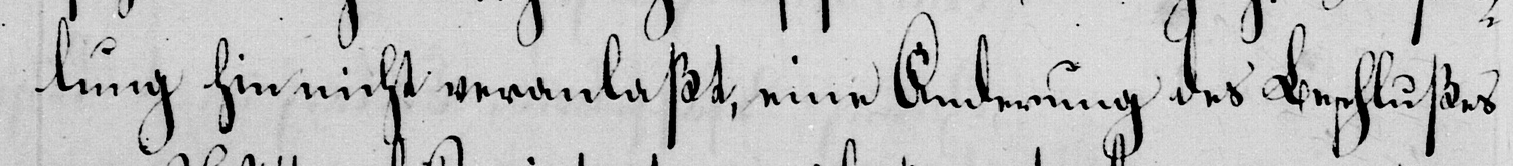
lung hin nicht veranlaßt, eine Änderung des Beschlußes
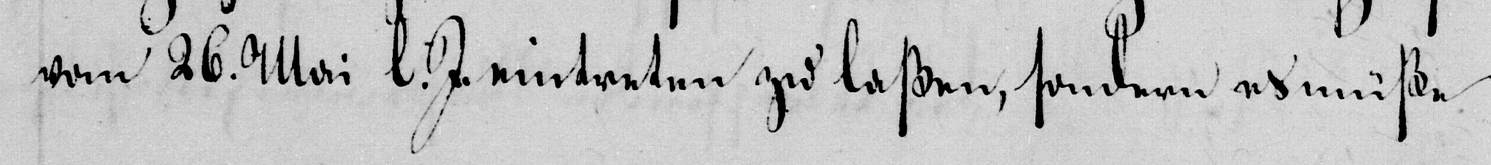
vom 26. Mai l. J. eintreten zu laßen, sondern es müße
